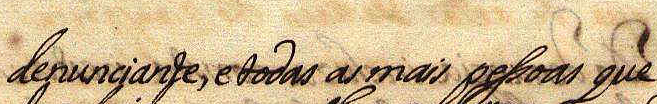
denunciante, e todas as mais pessoas que
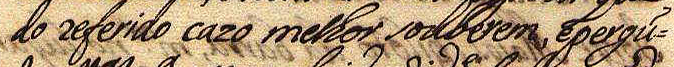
do referido cazo melhor souberem, e pergū
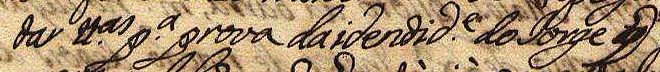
tar tt.as p.a prova da identid.e do Iorge q̄
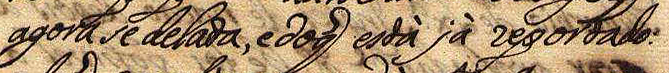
agora se delata, e do q̄ està já reportado:
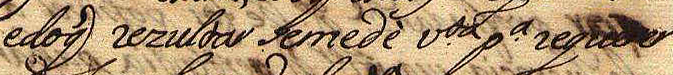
e do q̄ rezultar se me dè v.ta p.a requerer
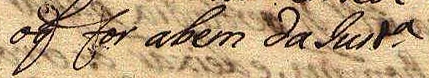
o q̄ for a bem da Iust.a
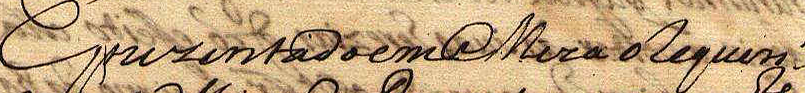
E prezentado em Meza o Requeri
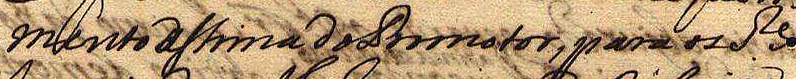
mento assima do Promotor, para os S.res
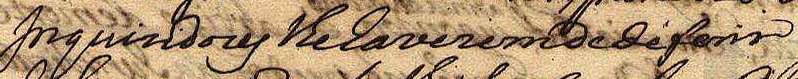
Jnquizidores lhe haverem de deferir
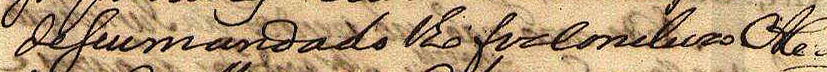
de seu mandado lho fiz Concluzo Ale
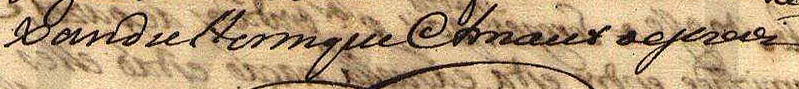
xandre Henrique Arnaur o escrevi
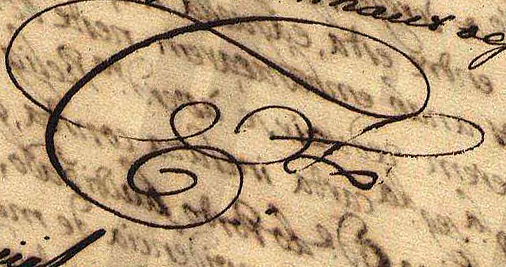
CLo
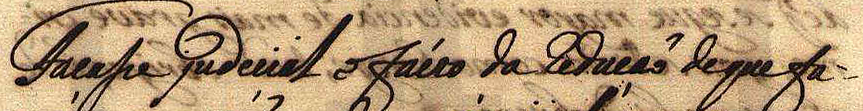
Façasse judicial o facto da Reduçaõ de que fa
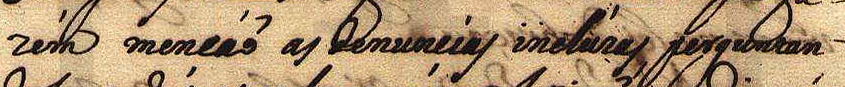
zem mençaõ as denunçias incluzas, perguntan
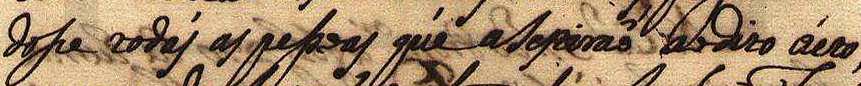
dosse todas as pessoas que asestiraõ ao dito acto
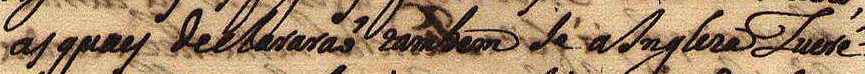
as quaes declararaõ tambem se a Ingleza Lucré
